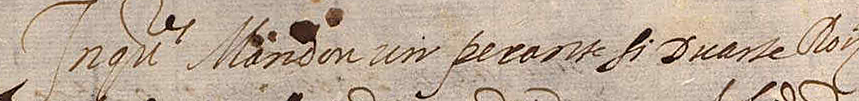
Jnqures Mandou uir perante si Duarte Roiz̄
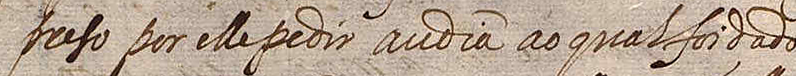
preso por elle pedir audiā ao qual foi dado
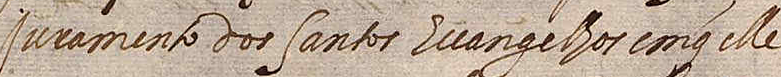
juramento dos Santos Euangelhos em q̄ elle
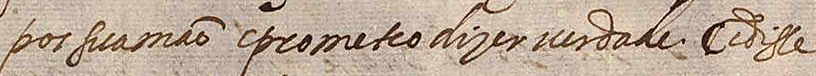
pos sua maõ e prometeo dizer uerdade. ¶ e disse
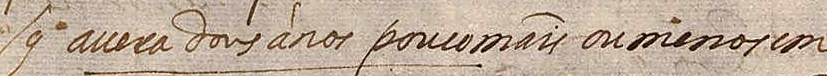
q̄ auera dous ānos pouco māis ou menos em
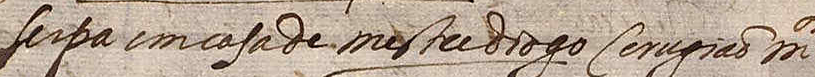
Serpa em casa de mestre diogo Cerugiaõ mor
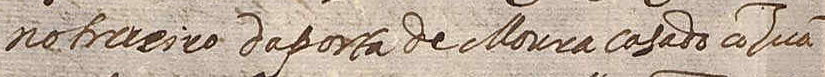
no terreiro da porta de Moura casado cō huā
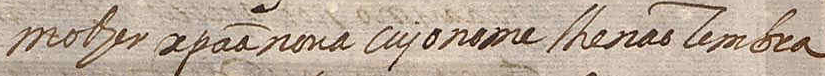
molher xpāa noua cujo nome lhe não lembra
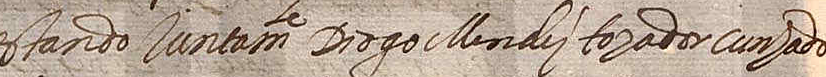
estando Iuntamte Diogo Mendez̄ tozador cunhado
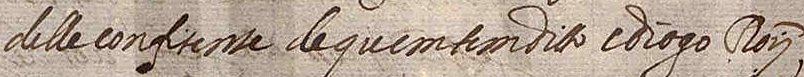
delle confitente de quem tem ditto e diogo Roīz
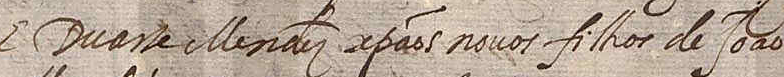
E Duarte Mend̄ez xpãos nouos filhos de Joaõ
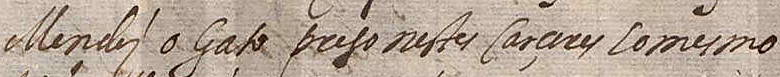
Mendez̄ o Gato preso nestes Carçeres E o mesmo
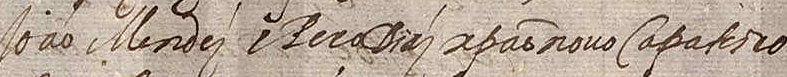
Joaõ Mendez̄ E Pero Diaz̄ xpaõ nouo Capateiro
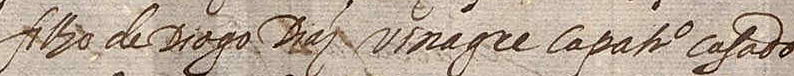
filho de Diogo Diaz̄ vinagre capatro casado
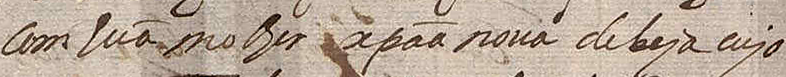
com huā molher xpāa noua de beja cujo
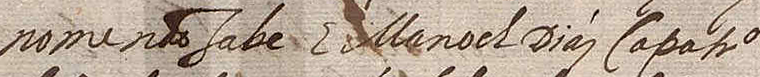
nome não sabe E Manoel Diaz̄ Capatro
